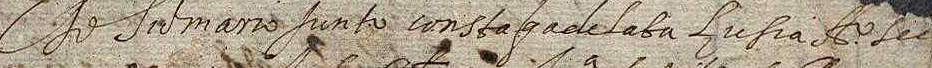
Do Sum̄ario junto consta q̄ a delata Luzia A.o Se c
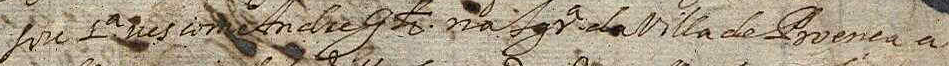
sou 1.a ues com Andre Gl̄z. na Igr.a da Villa de Proença a
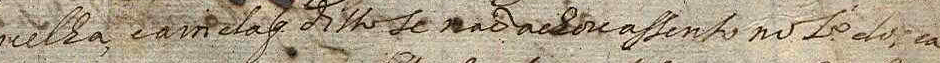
velha, com ela q̄ disso se naõ achou assento no L.o dos ca
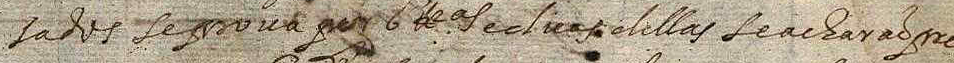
sados se proua per 6 tt.as e duas dellas se acharaõ pre
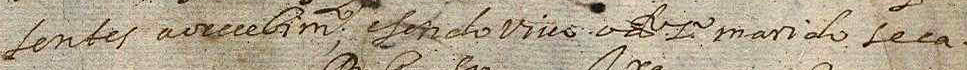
sentes ao recebim.to; e sendo viuo o d̄.o 1.o marido se ca
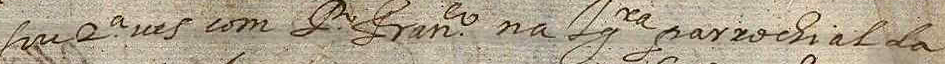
sou 2.a ues com P.o Fran.co na Ig.ra parrochial da
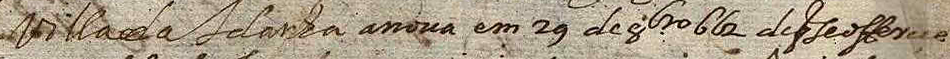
Villa da Idanha a noua em 29 de 8.bro 662 de q̄ se offereçe
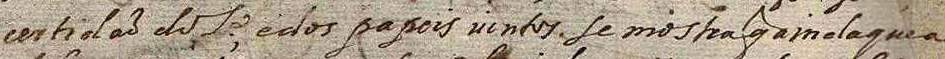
certidaõ do L.o e dos papeis iuntos. se mostra q̄ ainda que a
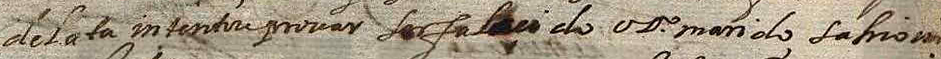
delata intentou prouar ser falecido o 1.o marido, sahio in
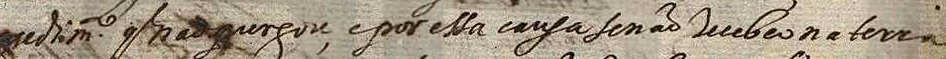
pedim.to q̄ naõ purgou, e por essa causa se naõ Recebeo na terra
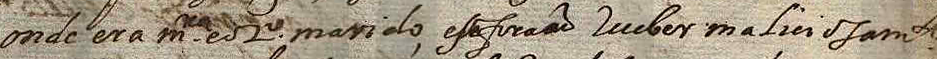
onde era m.ra e o 2.o marido, e se foraaõ Receber maliçiosam.te
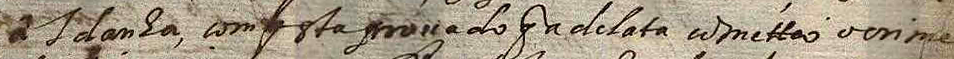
â Idanha, com q̄ esta prouado q̄ a delata cometteo o crime
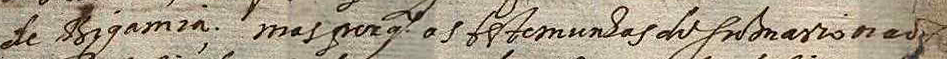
de Bigamia; mas perq.to as testemunhas do Sumario naõ fo
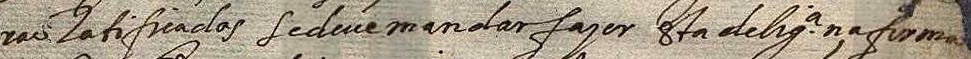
raõ Ratificadas se deue mandar fazer esta dilig.a na forma
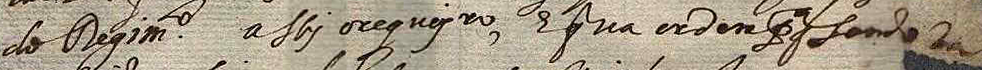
do Regim.to assy o requeyro, e q̄ na orden p.a q̄ sendo Ra
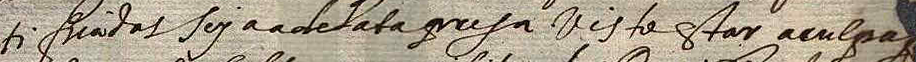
tificadas seya a delata preza visto estar a culpas
